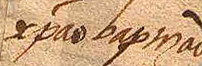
xpão baptizado
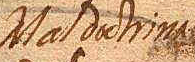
Mal doctrina
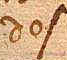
do /
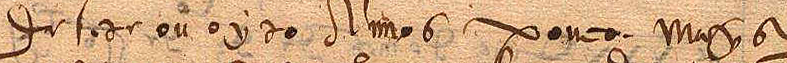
de sete ou oyto An̄nos pouco mays
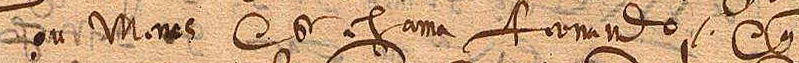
ou menos e se chama fernando /. e q̄
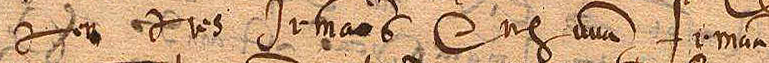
tem tres Jrmãos e nhūua Jrmaã
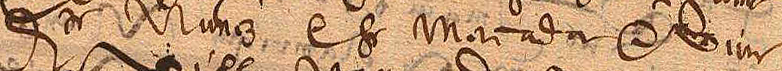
drte Nun̄ez e he mercador e viue
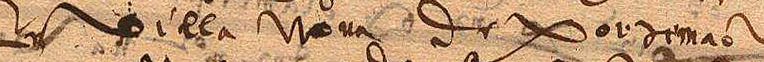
em villa noua de portimaõ
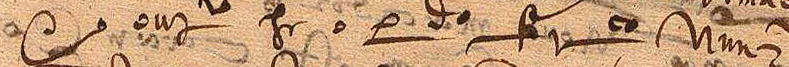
e o outro he o Ldo frco nunez̄
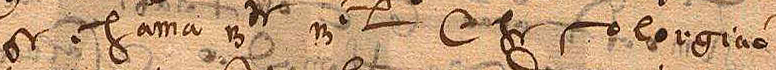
se chama mte meL e he solorgiaõ
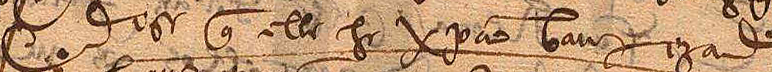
e dise q̄ elle he Xpão bautizado
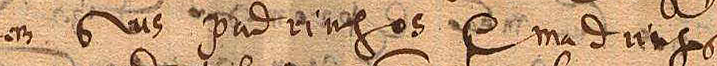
tem seus padrinhos e madrinhas
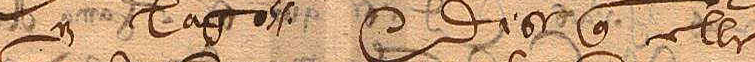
em lagos /. e dise q̄ elle
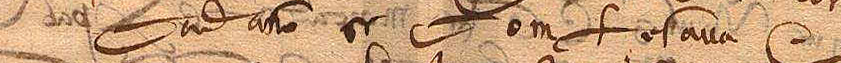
Cada an̄o se Comfesaua e
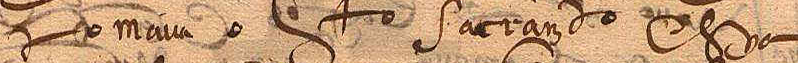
tomaua o Sto Sacramto e hya
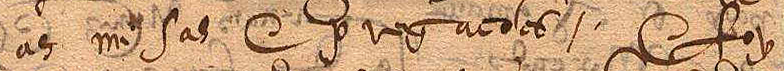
as misas e pregaçoēs /. e foy
